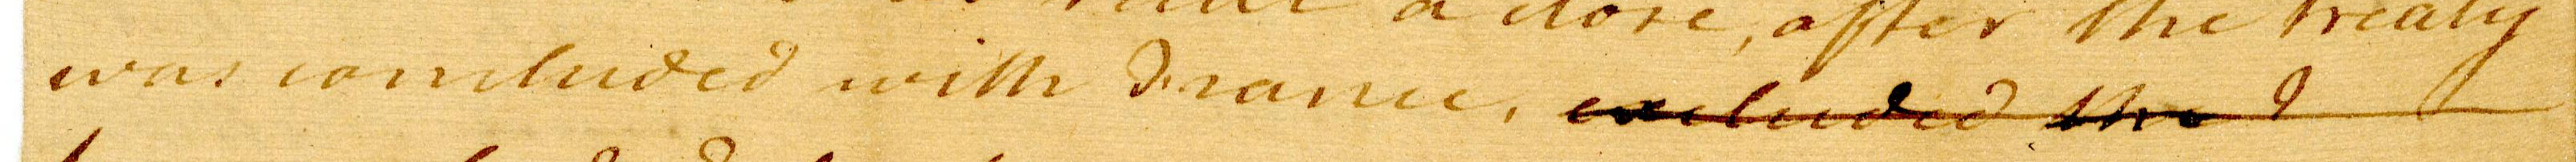was concluded with France, [excluded the]
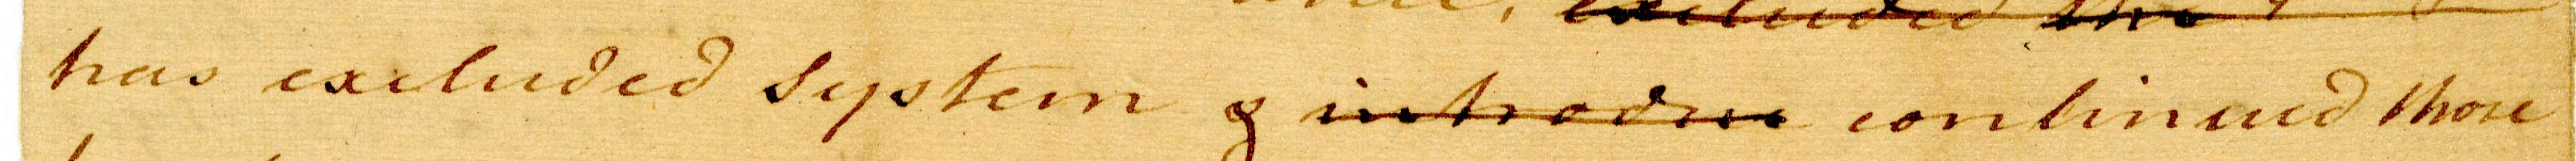has excluded system & [introdu] continued those
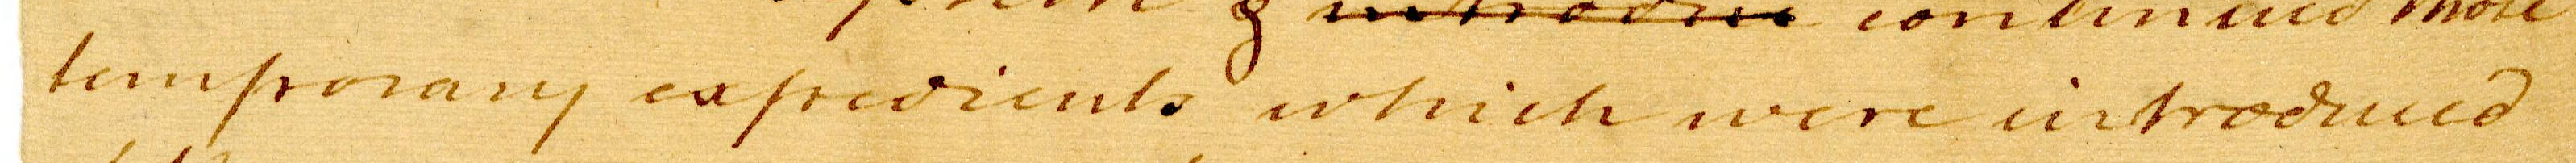temporary expedients which were introduced
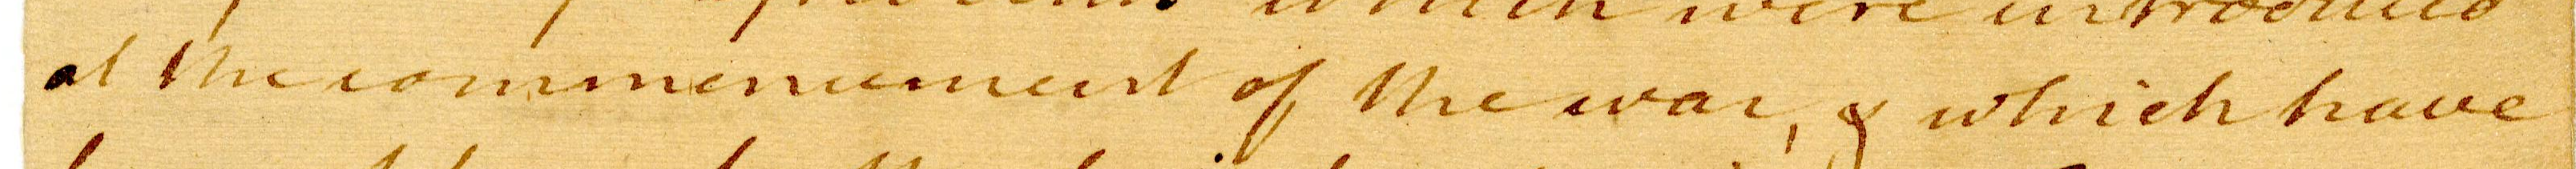at the commencement of the war, & which have
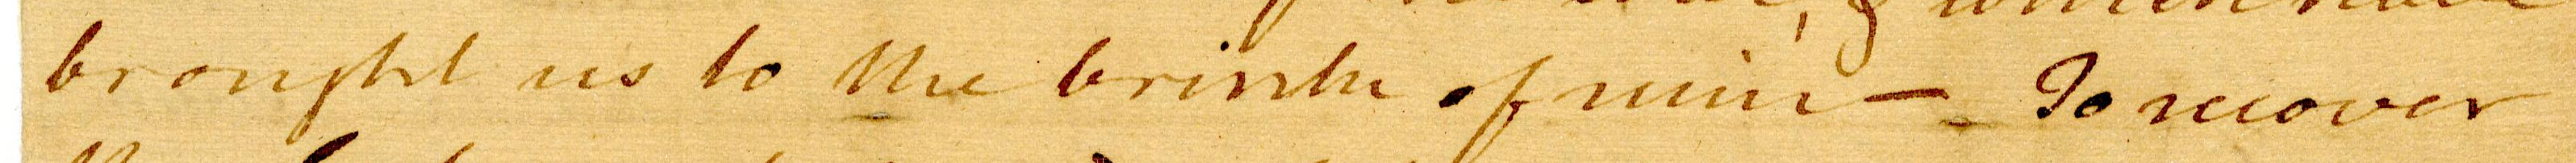brought us to the brink of ruin- To recover
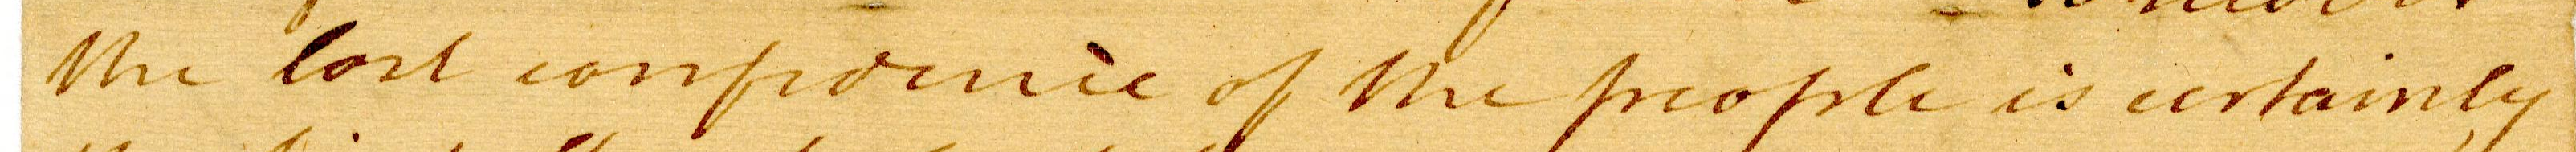the lost confidence of the people is certainly
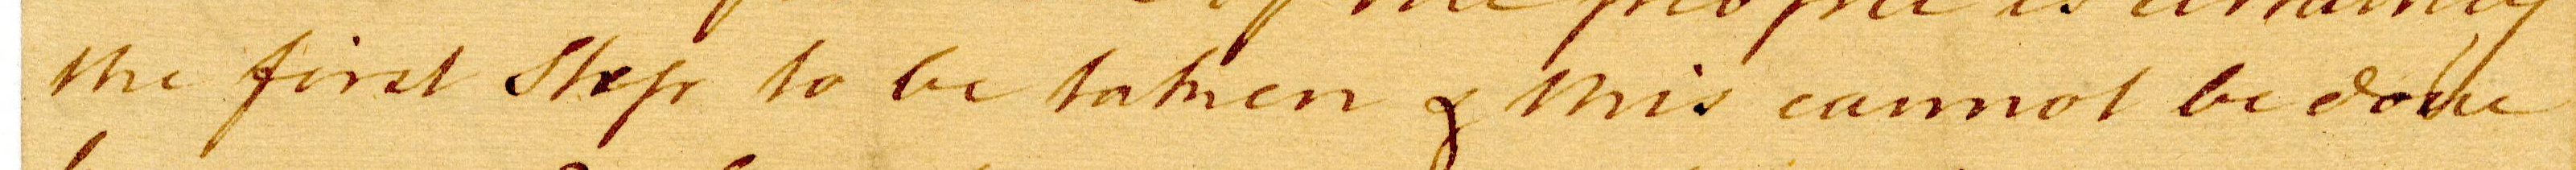the first step to be taken & this cannot be done
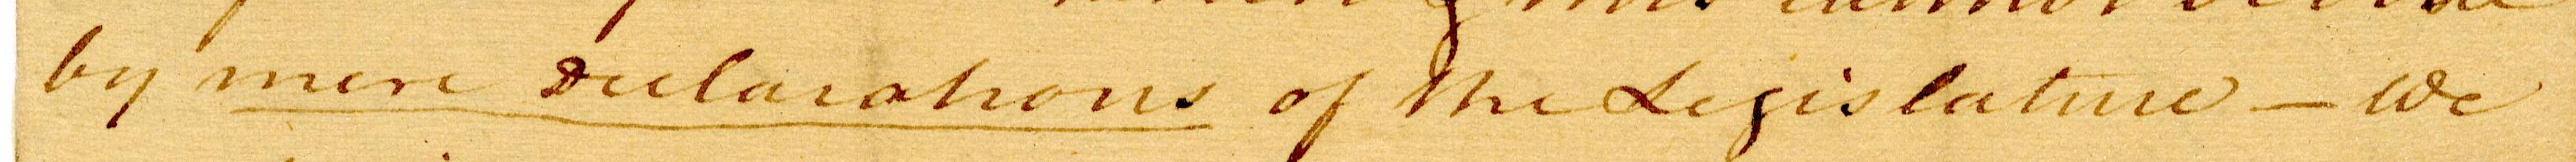by mere declarations of the Legislature- We
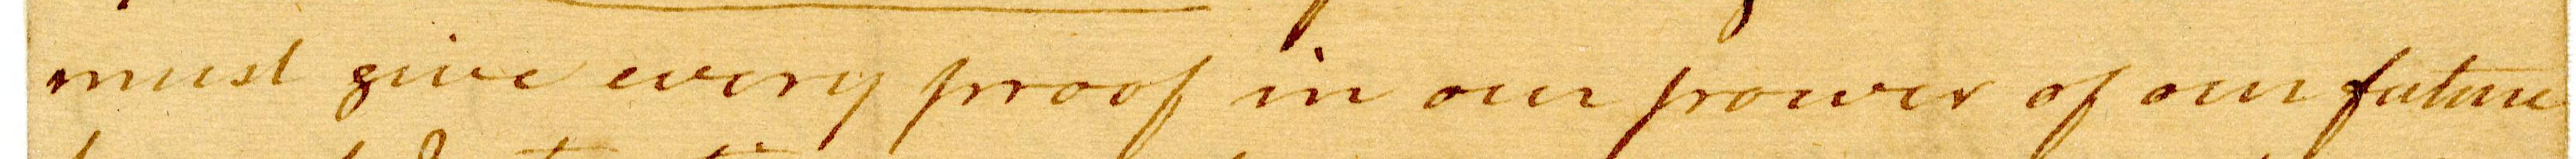must give every proof in our power of our future
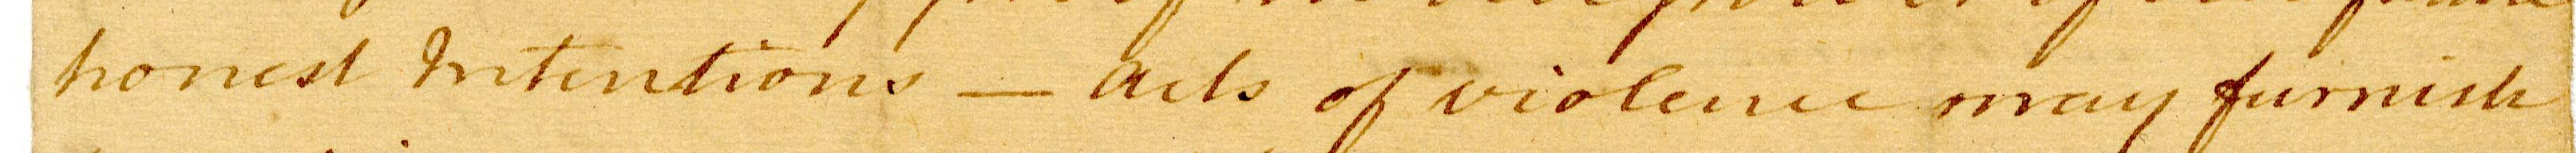honest Intentions- Acts of violence may furnish
